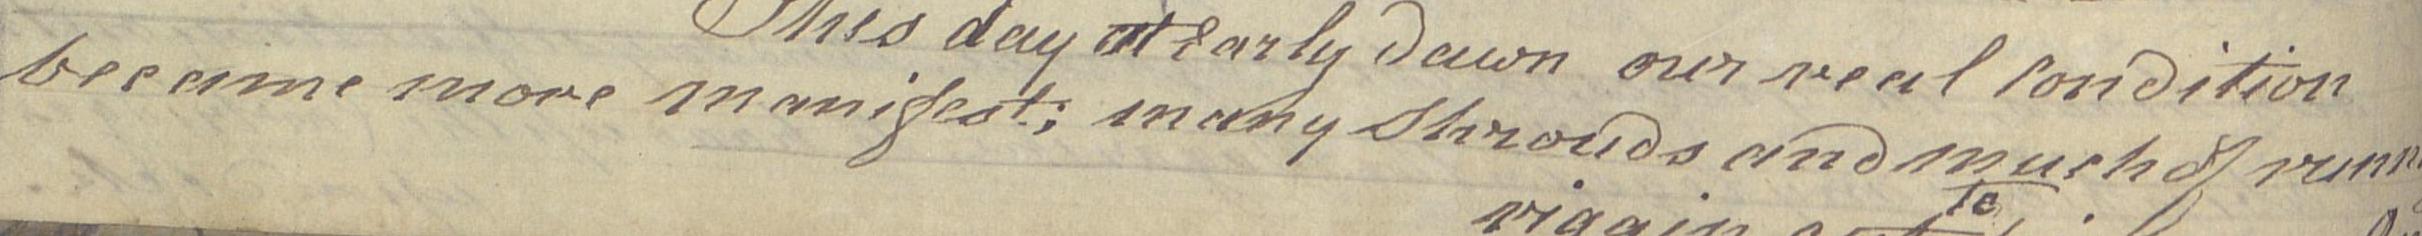became more manifest, many shrouds and much of runn-
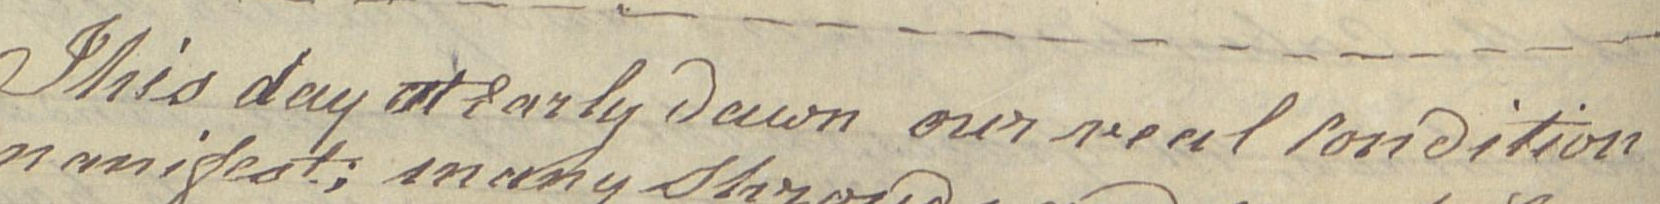This day at early dawn our real condition
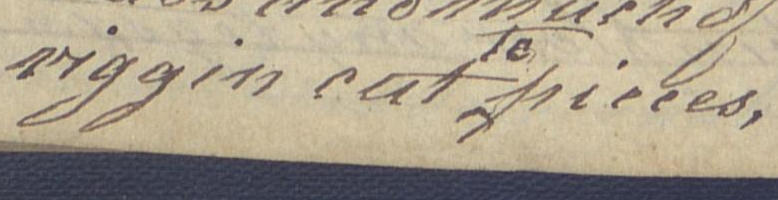riggin cut ^ pieces,
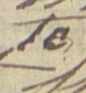to
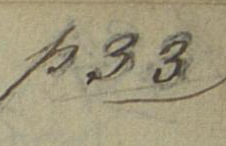p 33
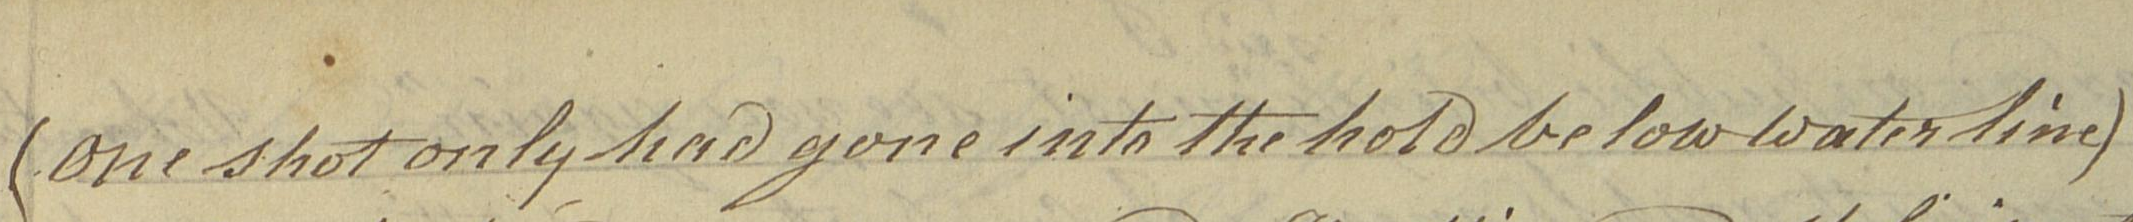(one shot only had gone into the hold below water Line)
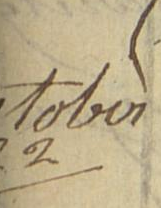-tober
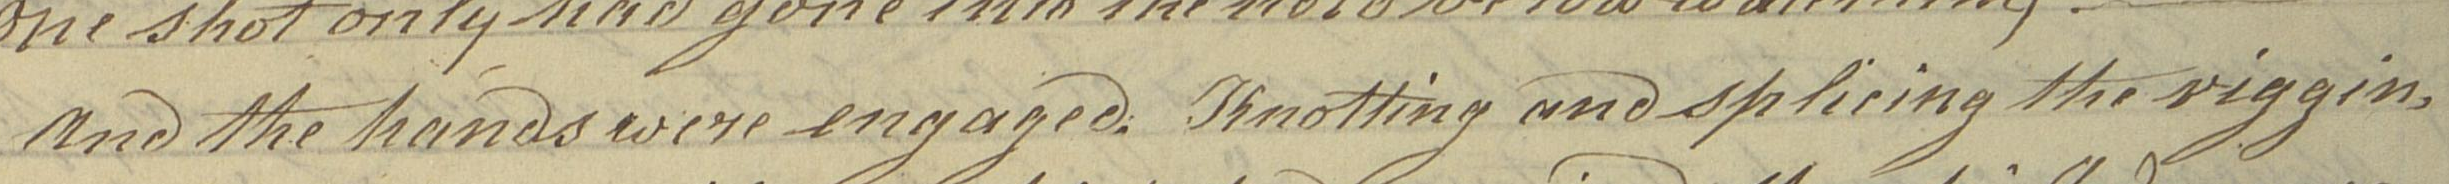and the hands were engaged Knotting and splicing the riggin,
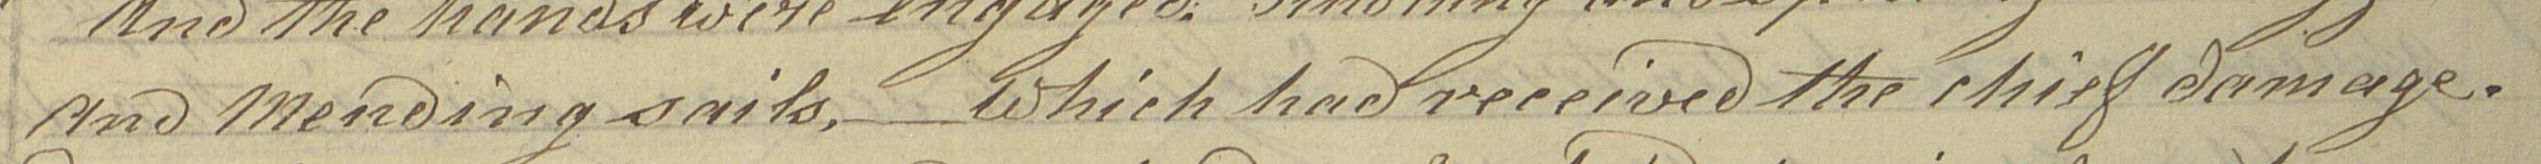and mending sails, which had received the chief damage.
